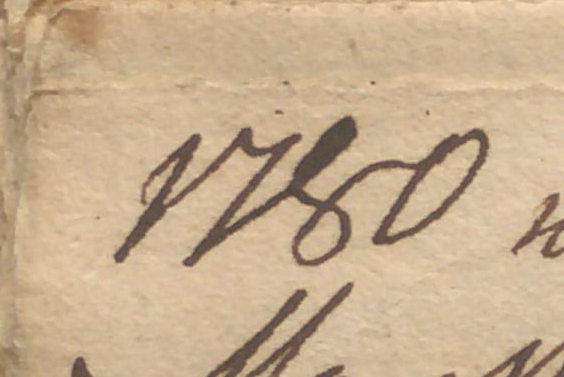1780
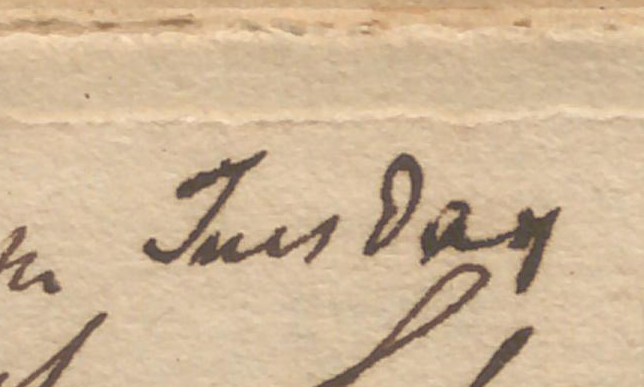Tuesday
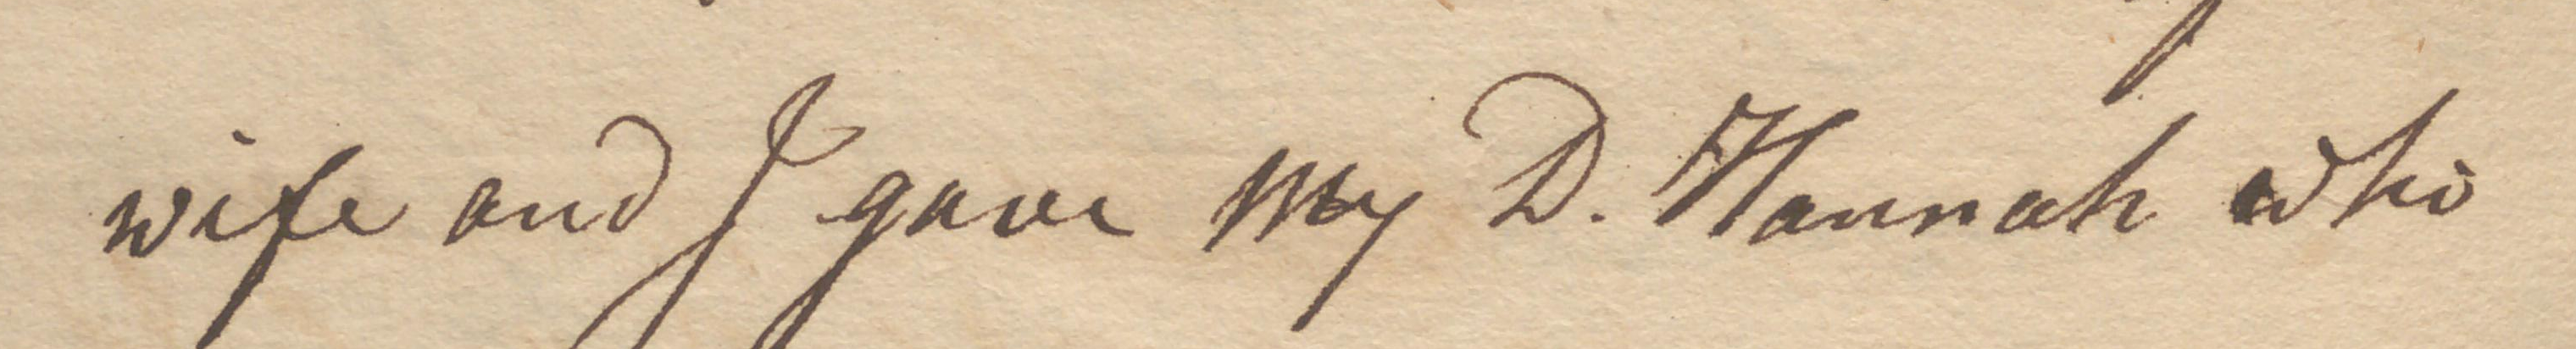wife and I gave My D. Hannah who
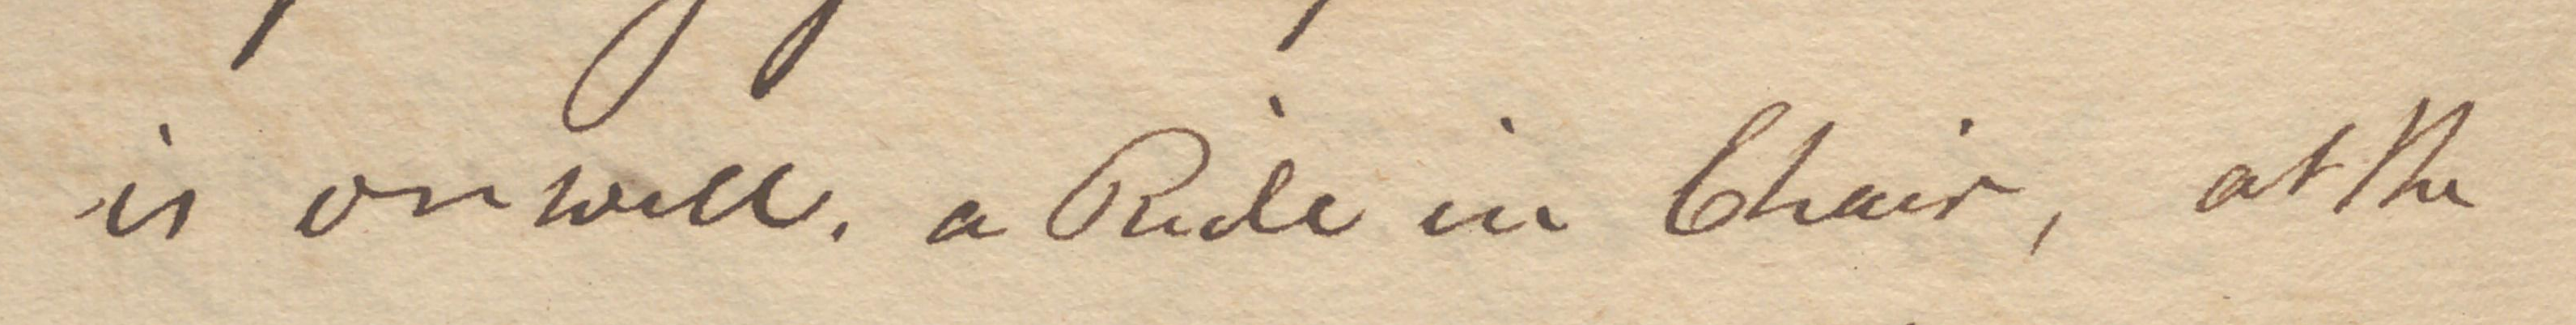is unwell, a Ride in Chair, at the
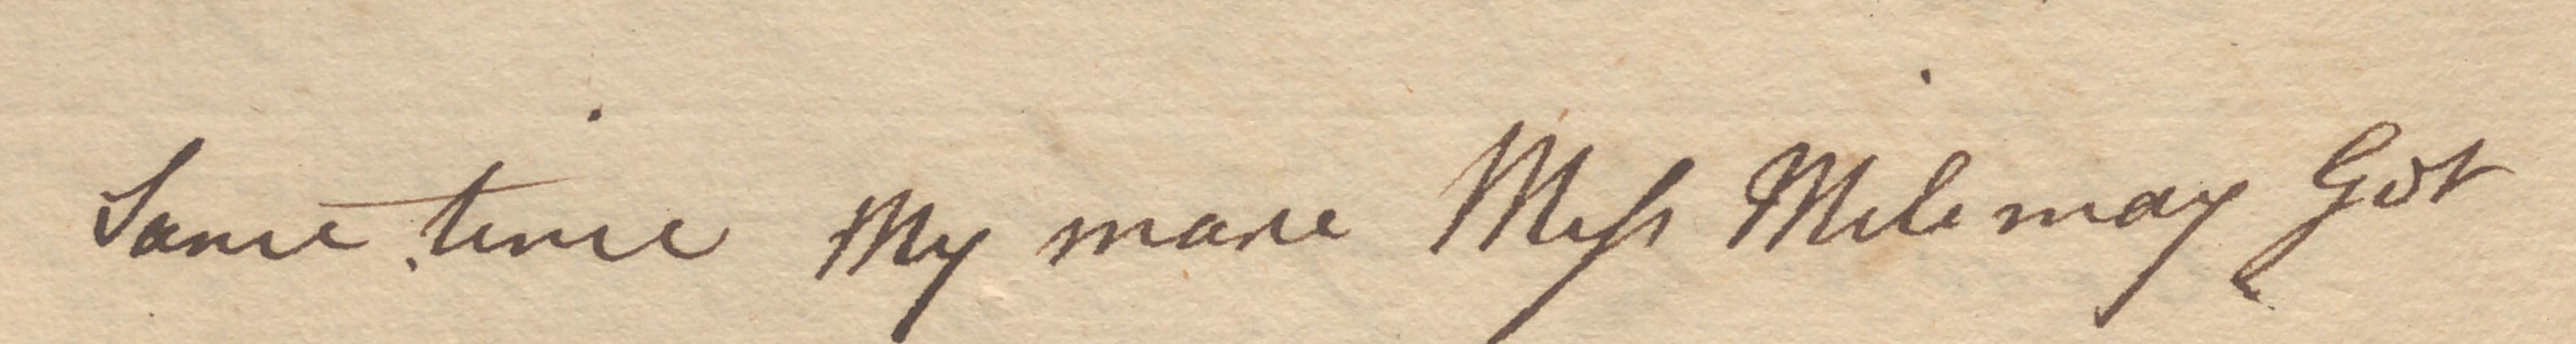same time My mare Miss Milemay Got
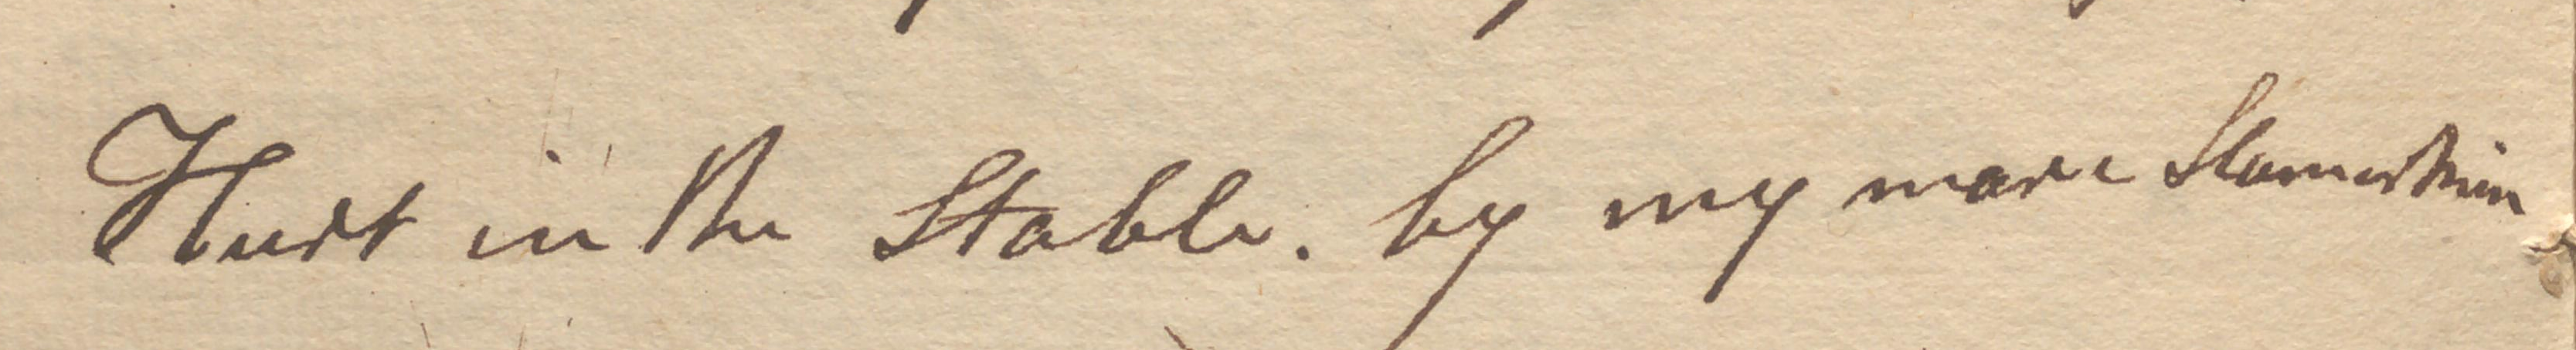Hurt in the Stable by my mare Slamerkin
